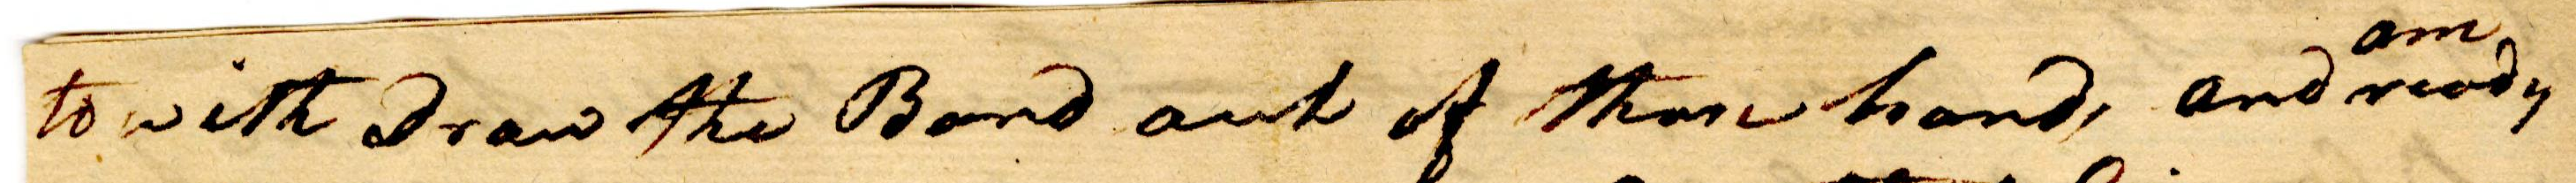to withdraw the Bond out of those hands and ready
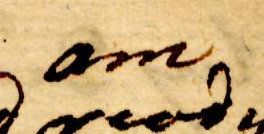am
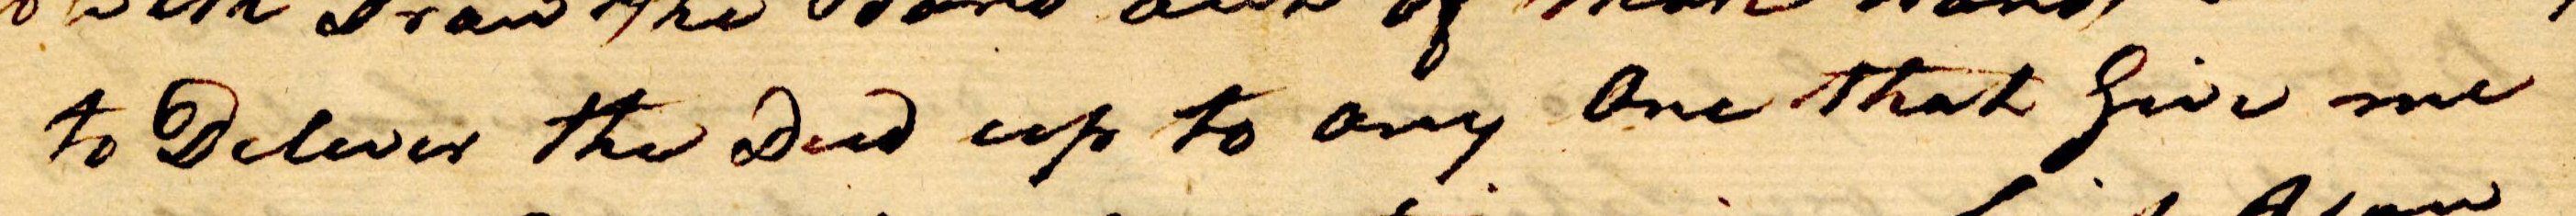to Deliver the Deed up to any one that give me
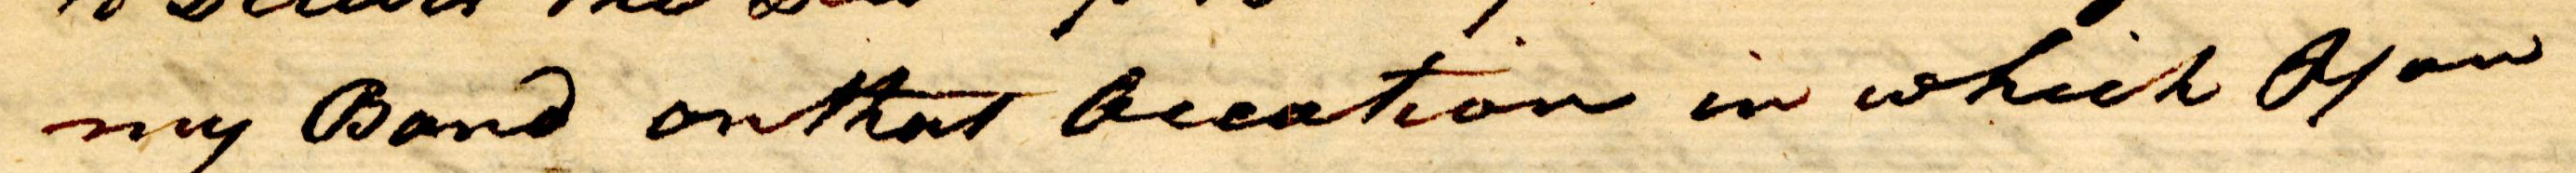my Band on that Creation in which you
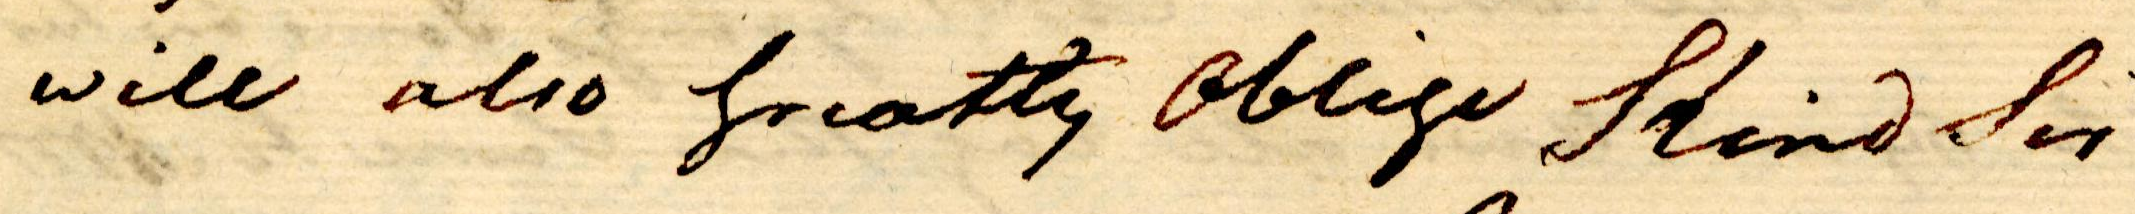will also greatly oblige I kind Sir
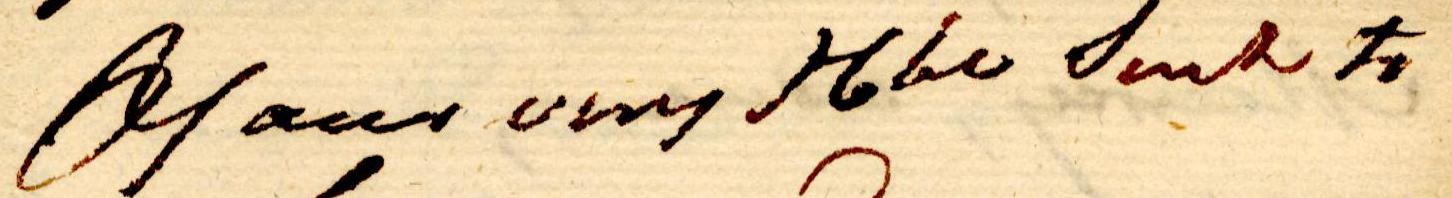your very H^bl Serv^t to
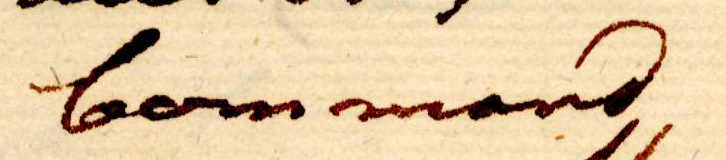command
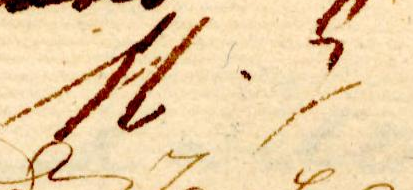M. G
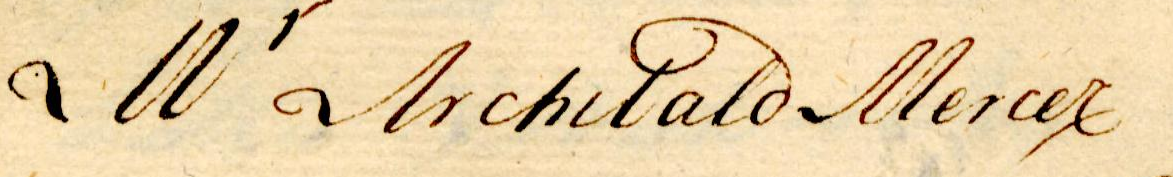M^r Archibald Mercer
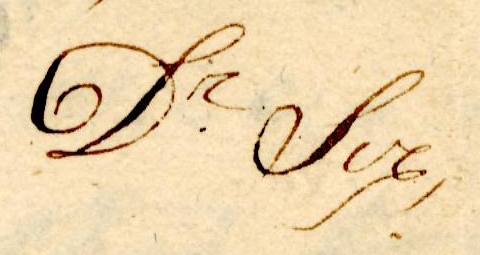D^r. Sir,
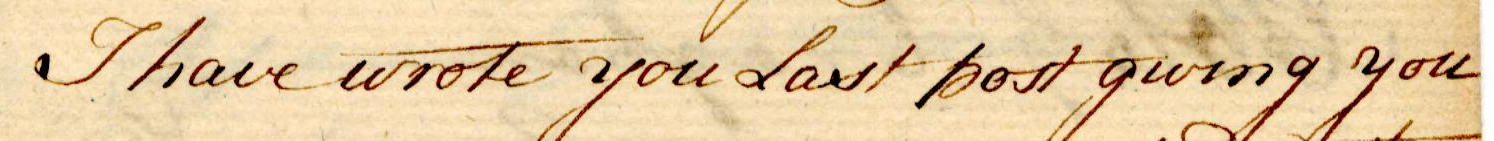I have wrote you Last post giving you
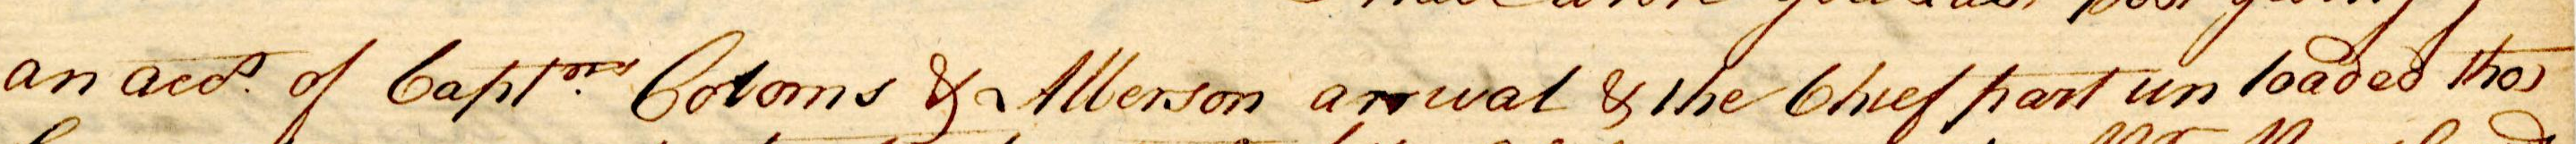an acc^t. of Capt^n. Coloms & Allerson arrival & the Chief part un loaded tho,
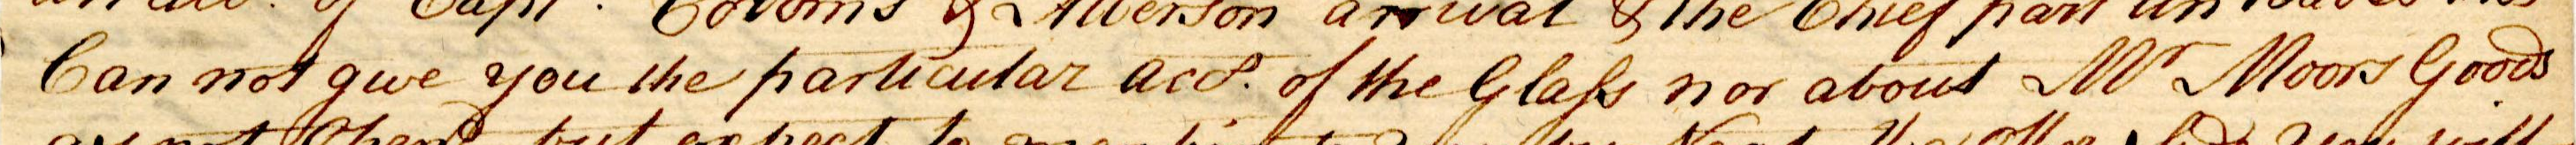can not give you the particular acc^t. of the Glass nor about M^r. Moors Goods
